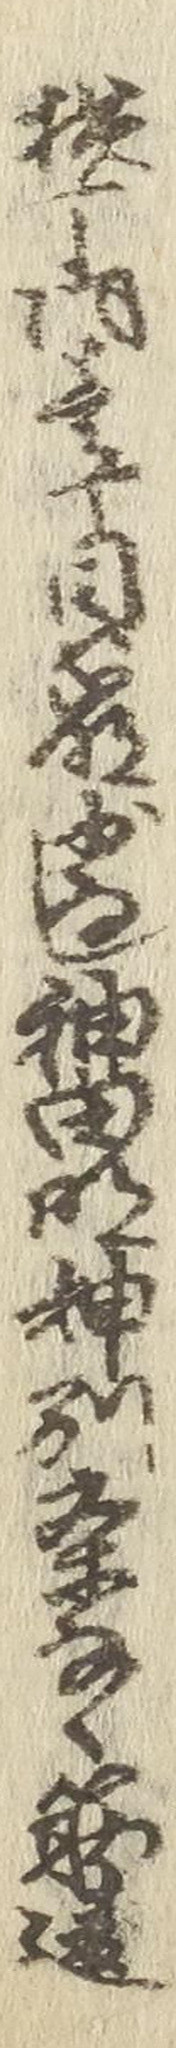横丁同壱丁目崩少なし神田明神別条なく筋違
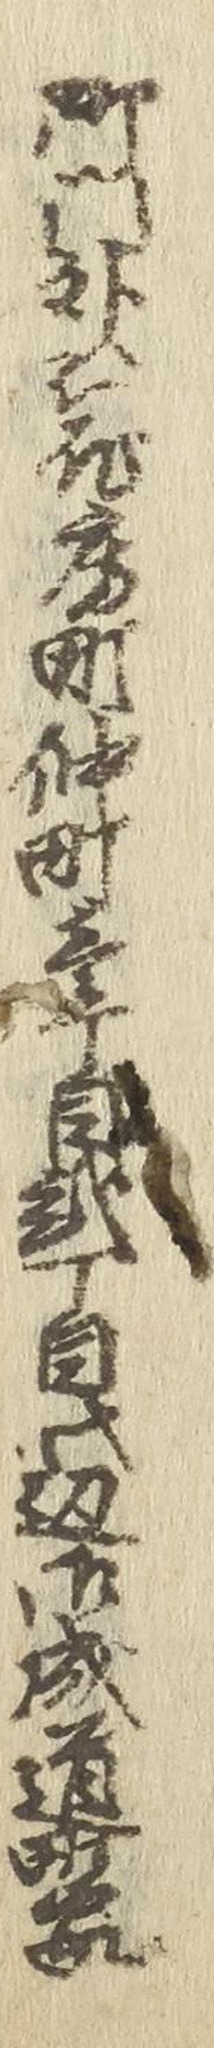御門外は花房町仲町壱丁目弐丁目此辺御成道町家
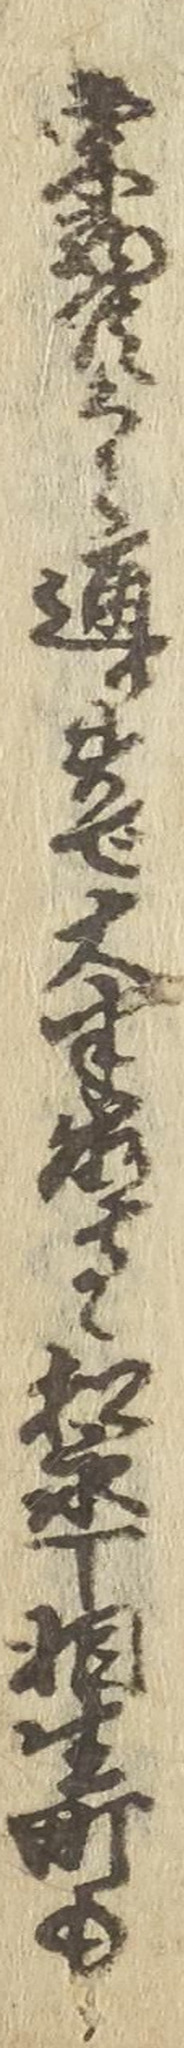東西共うら通りまで大半崩るゝ松永丁相生町も

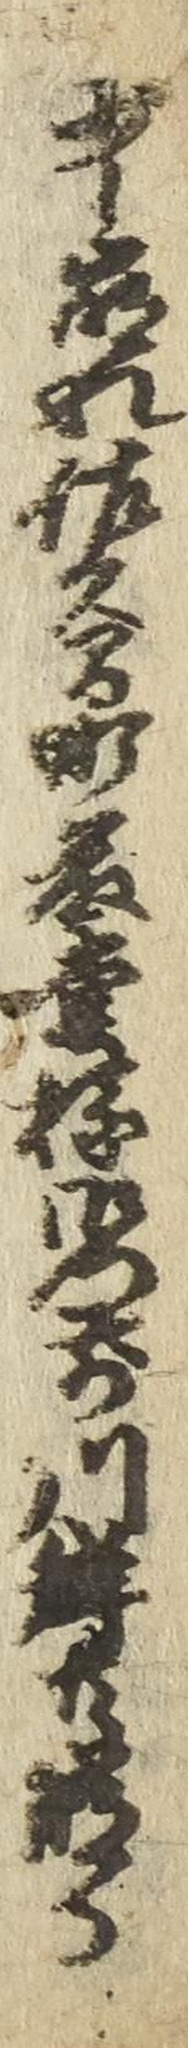少し崩れ佐久間町藤堂様御門前川岸共崩るゝ
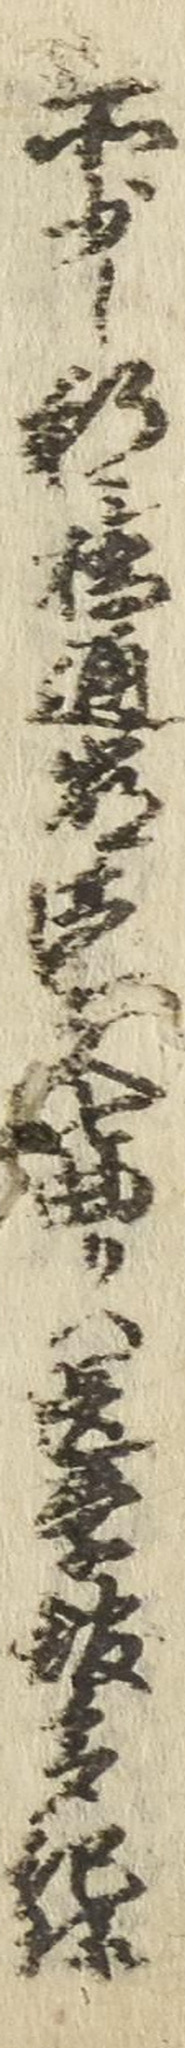所少し新橋通崩多し七曲りは医学館多紀様
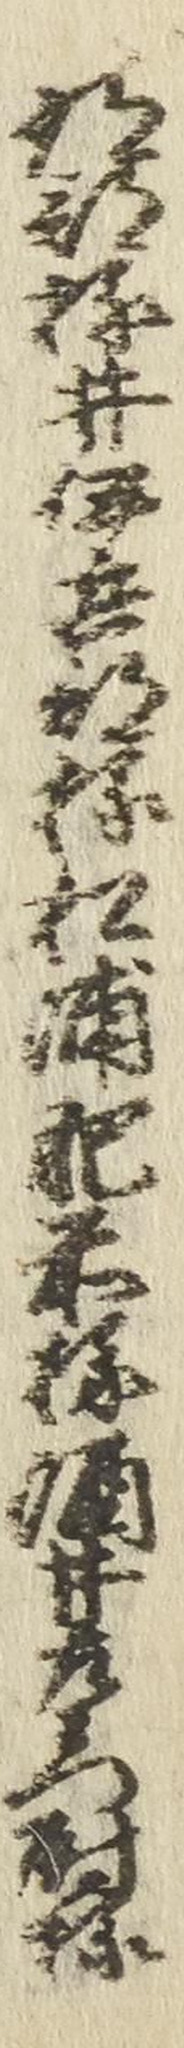跡部様井伊兵部様松浦肥前様酒井左衛門尉様
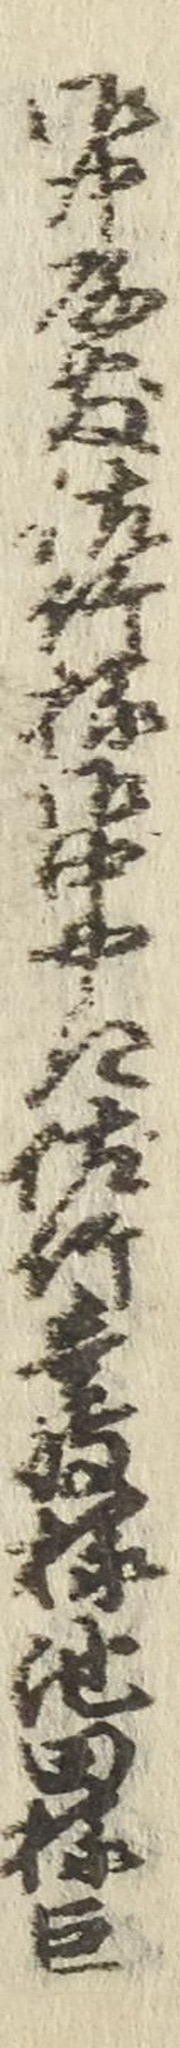御中屋敷佐竹様御中やしき佐竹壱岐様池田様巨
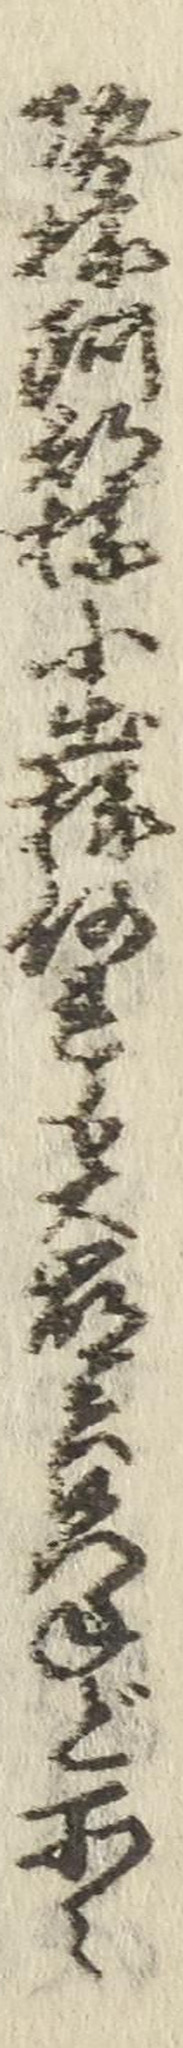勢様阿部様小出様何れも大崩二はあらねど所々
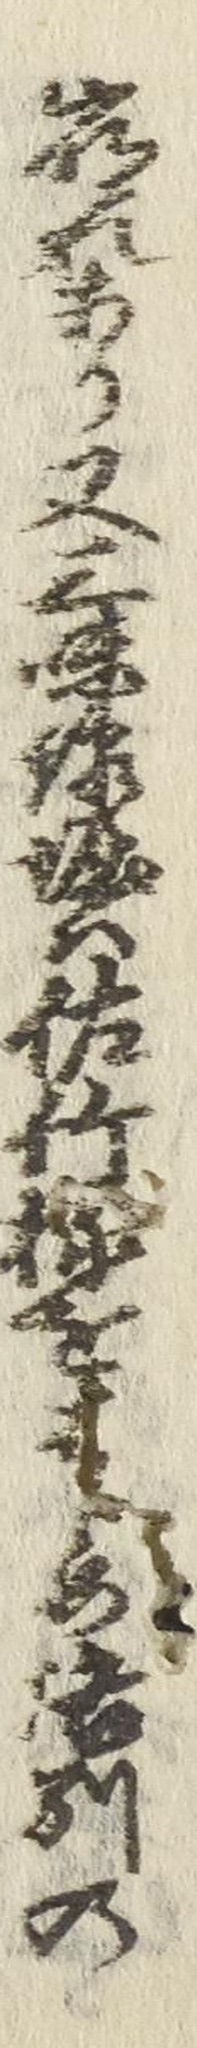崩れあり又三味線堀は佐竹様をはじめ各別の
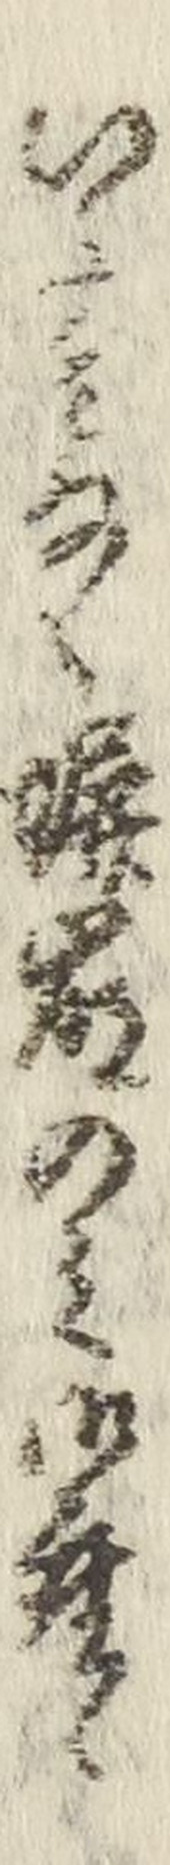いたみなく塀崩のみ御座候
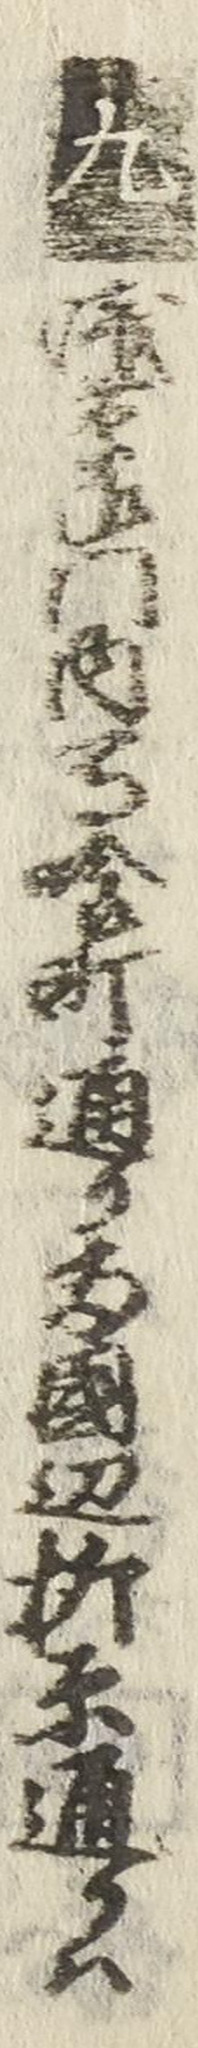九浅草御門内馬喰町通り両国辺柳原通りは
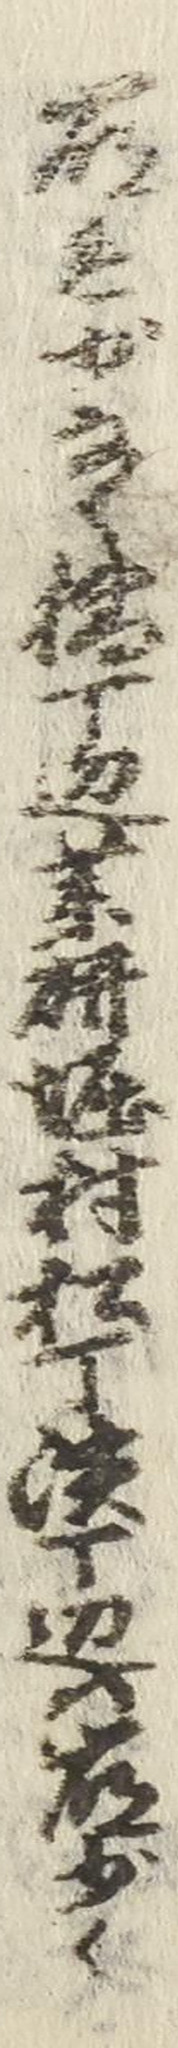崩れ少なく橋町辺薬研堀村松丁浜丁辺は崩少く
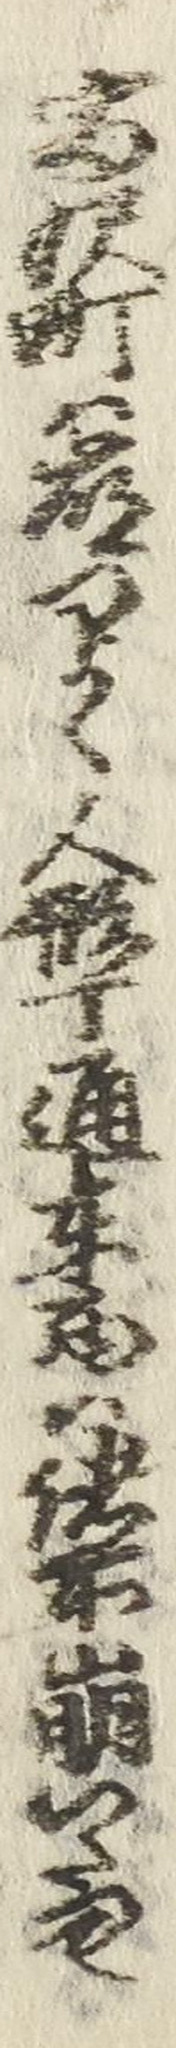富沢町は崩つよく人形丁通東西は諸所崩いたつて
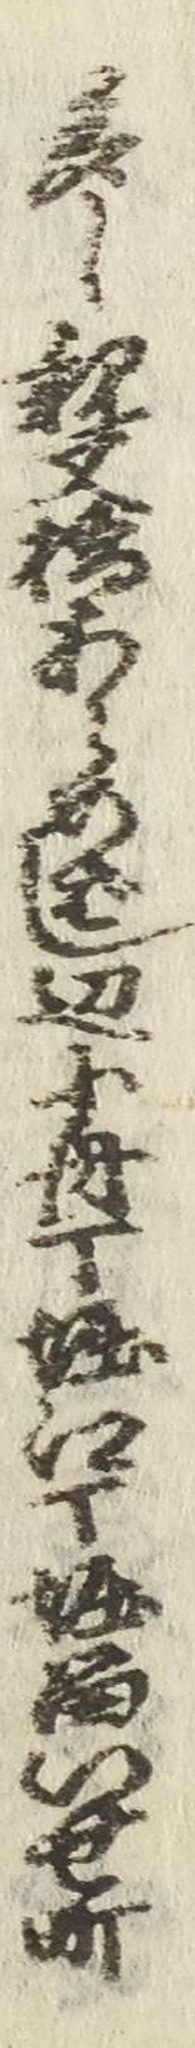多し親父橋あらめばし辺小舟丁堀江丁堀留いせ町
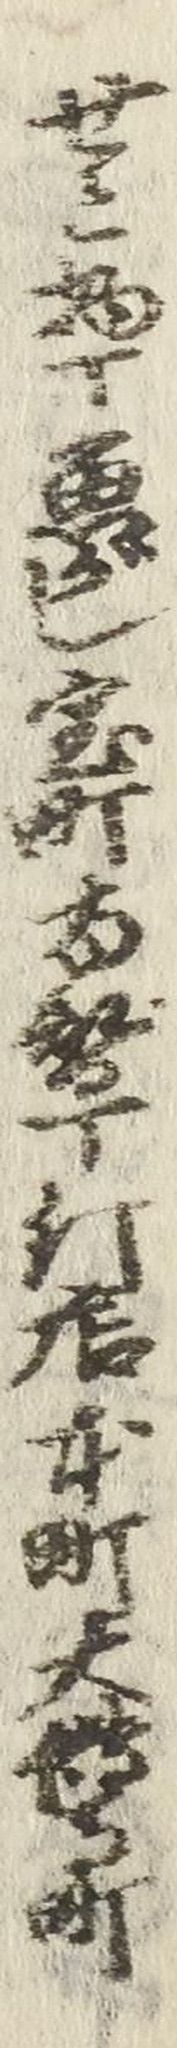せと物丁魚がし室町両替丁釘店本町大伝馬町
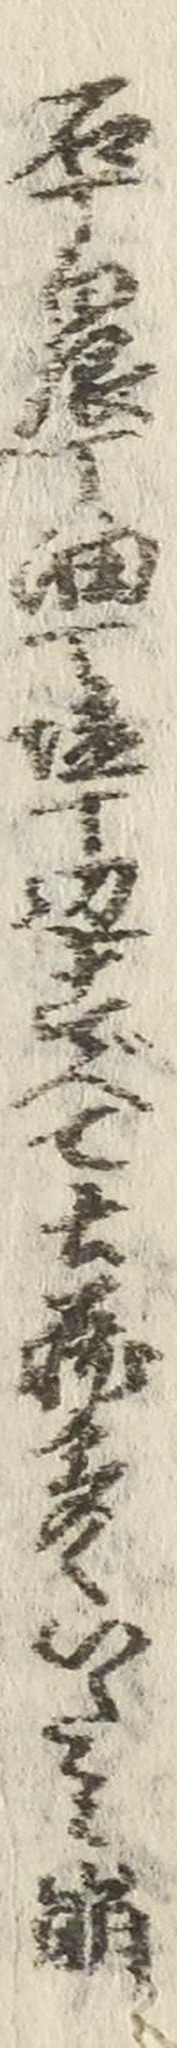石丁白銀丁油丁塩丁辺すべて土蔵多くいたみ崩
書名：地震出火　男女死人怪我人書上之寫
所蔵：東京大学地震研究所図書室 Earthquake Research Institute Library, The University of Tokyo, JAPAN
